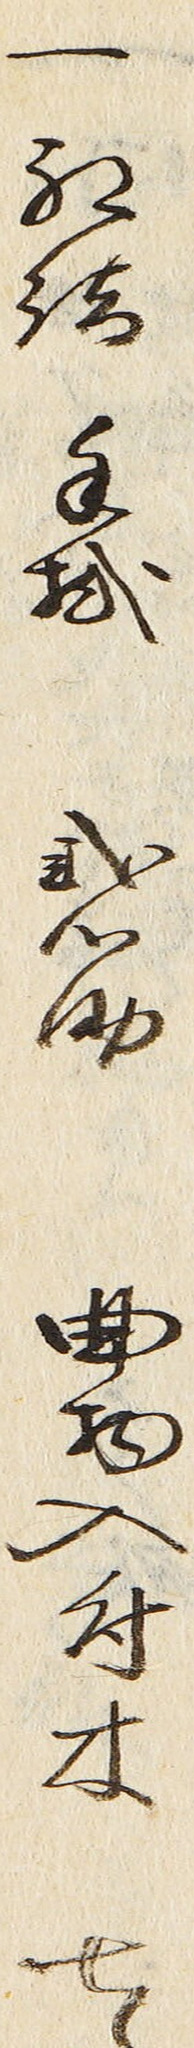一紅絹手拭式筋曲物入付木七ツ
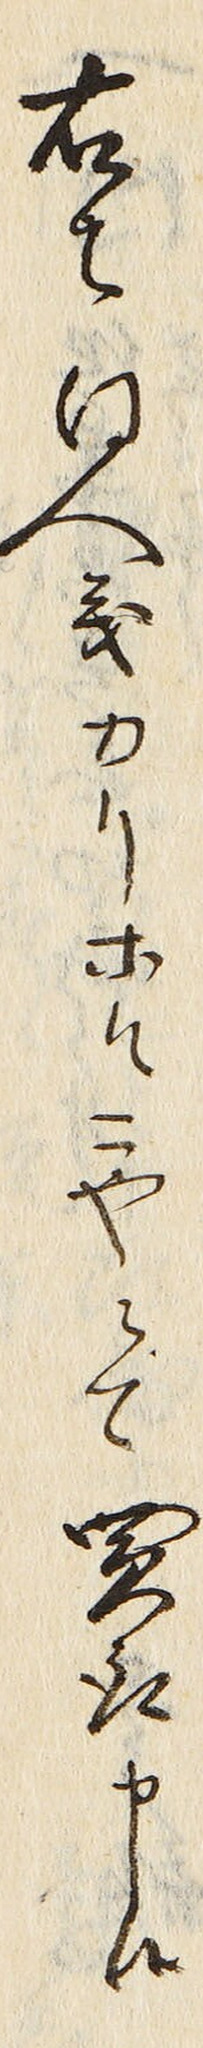右は同人義カリホルニヤにて買取申候
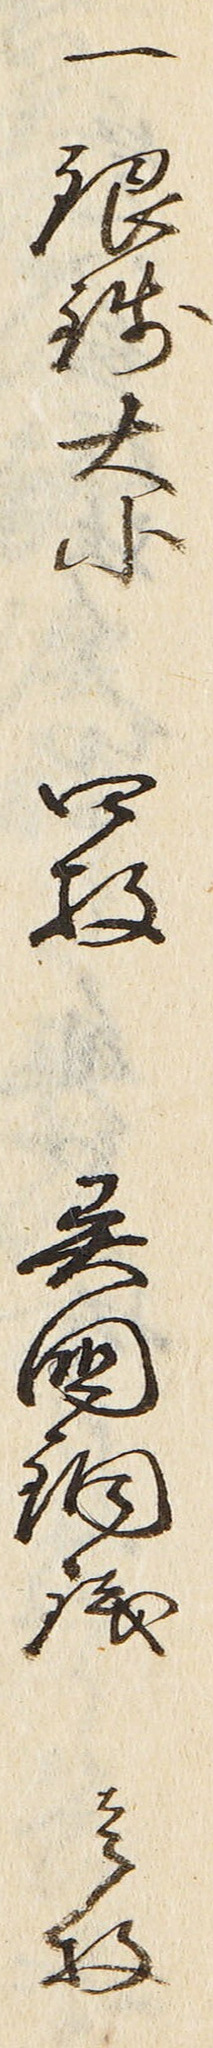一銀銭大小四枚異国銅銭壱枚
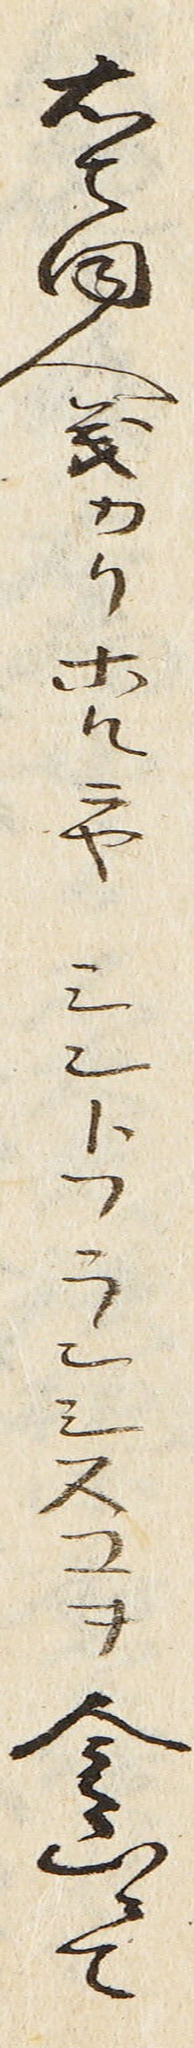右は同人義カリホルニヤシントフランシスコヲ金山にて
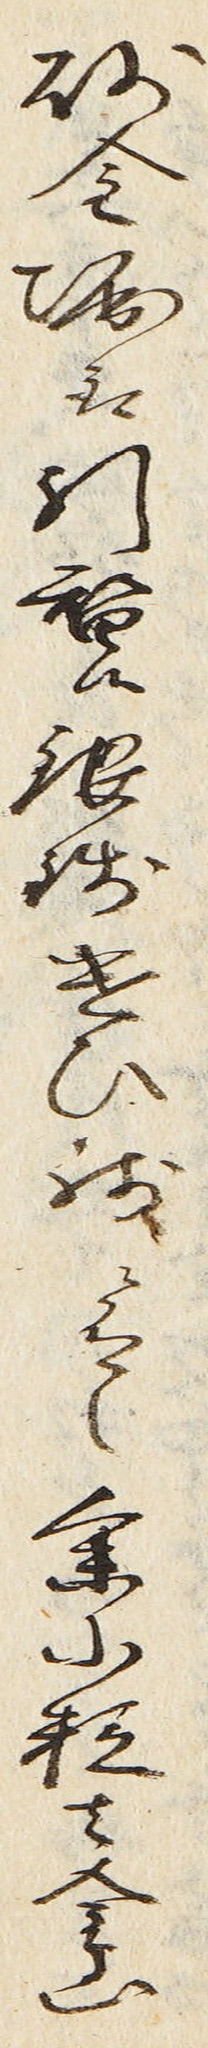砂金掘取引替候銀銭遣ひ残に有之余小粒は金山
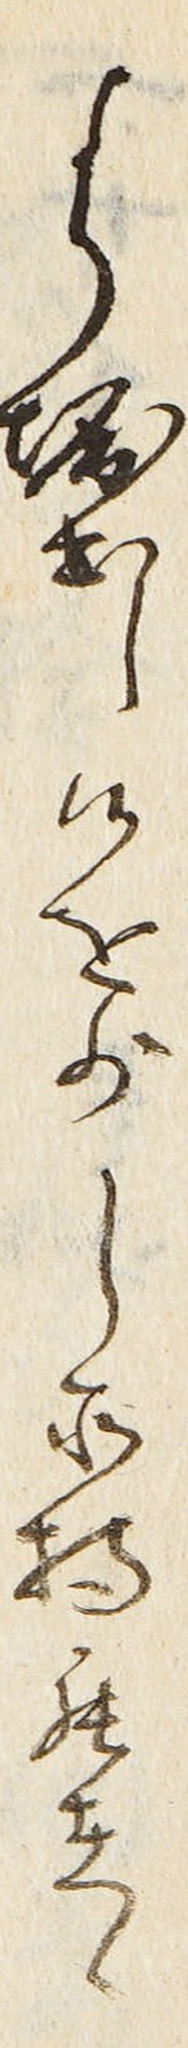より掘出し候を少し所持罷在候
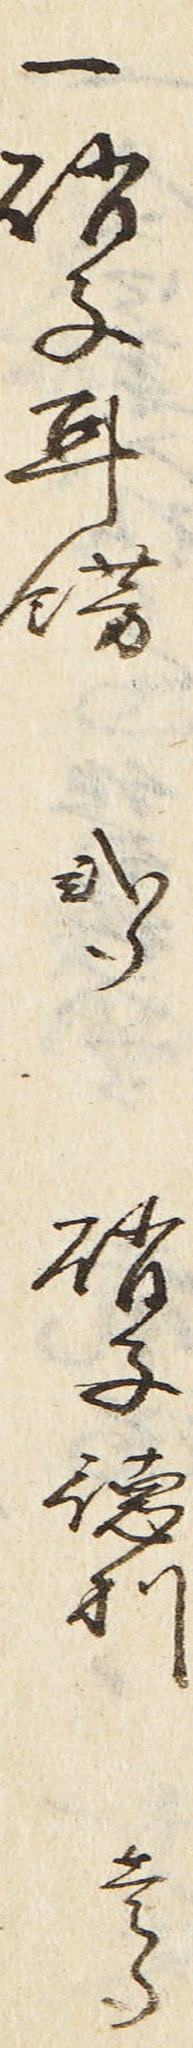一硝子耳餝弐ツ硝子徳利壱ツ
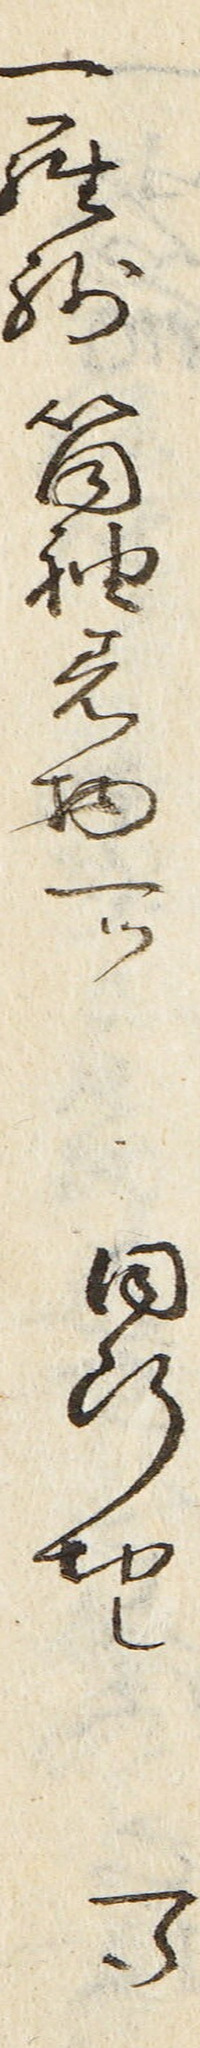一羅紗筒袖着物一ッ同断切れ一ツ
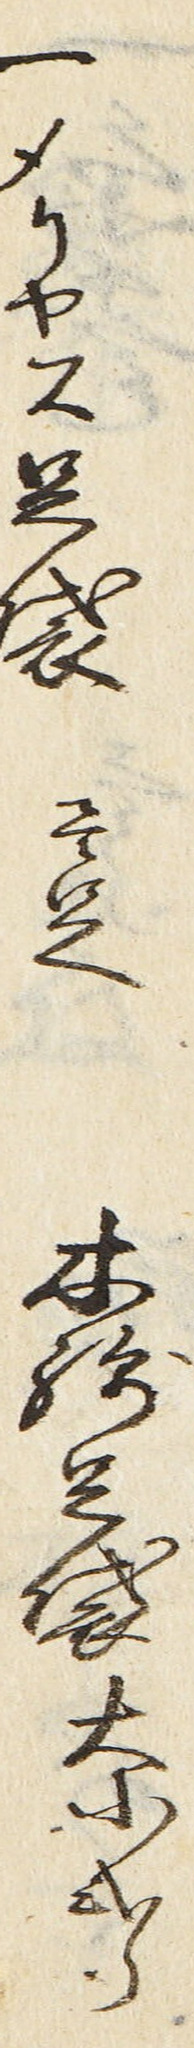一メリヤス足袋壱足木綿足袋大小弐ツ

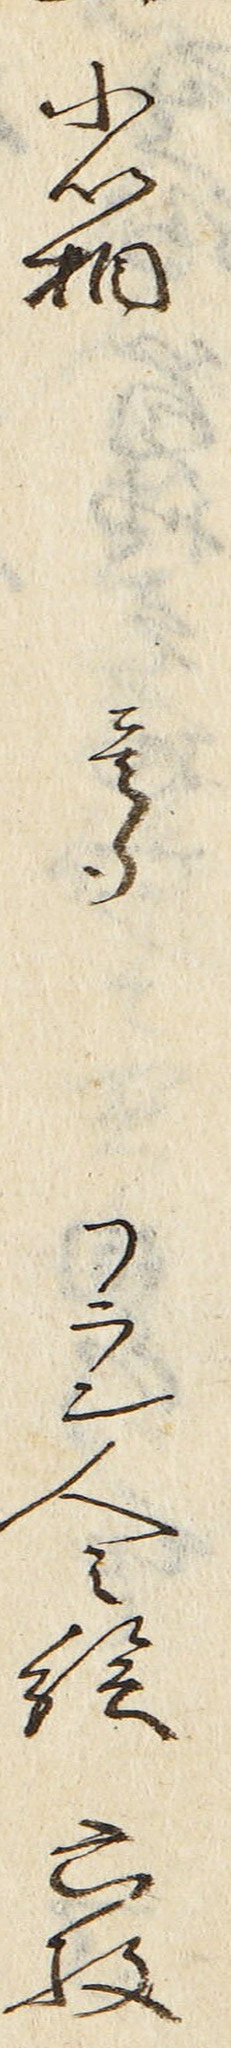一小箱壱ツフラン人之絵六枚
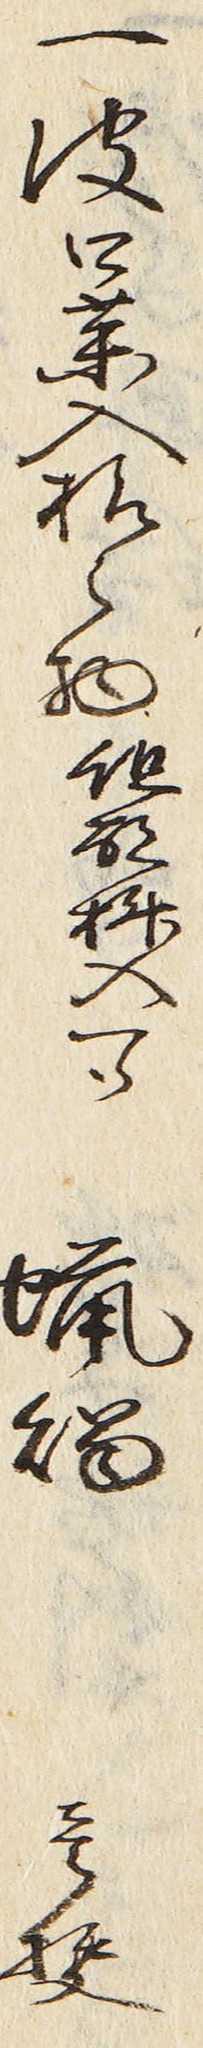一皮口茶入様之物但入一ツ蝋燭壱挺
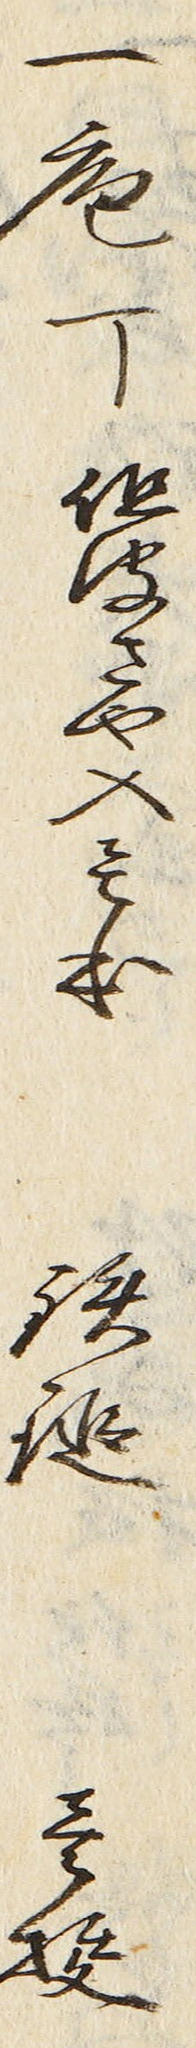一庖丁但皮さや入壱本鉄鎚壱挺
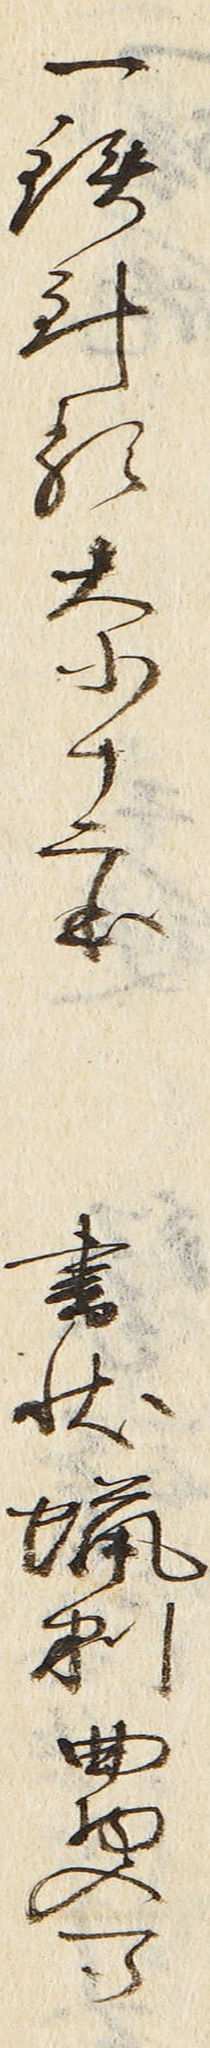一鉄針類大小十二本書状蝋判曲物入一ツ
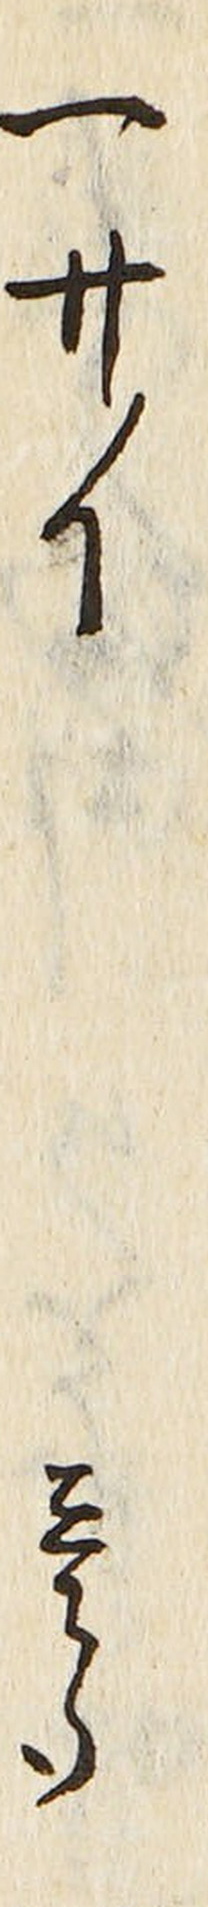一サイ壱ツ
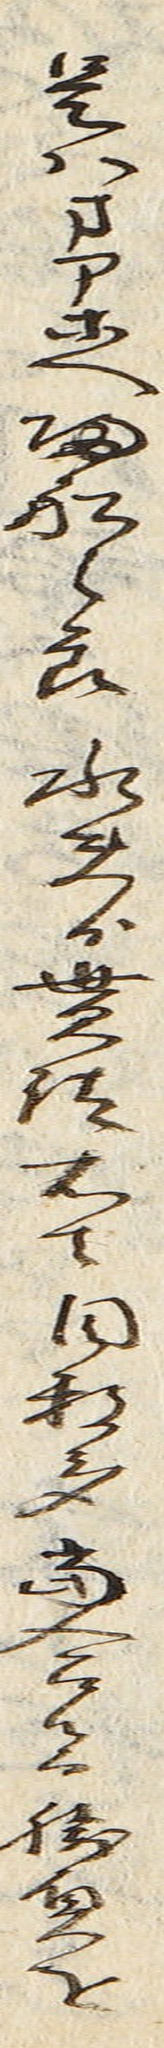是はオアホへ帰船之節水夫ゟ貰請右は目数多当合候而勝負を
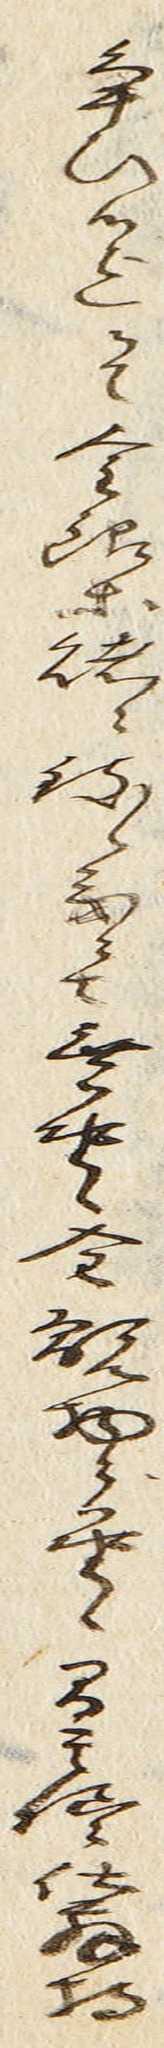争ひ候迄にて金銀等賭に致候義には無御坐候全顕物に御坐候間其侭仕舞持
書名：土佐中浜万次郎漂流記
